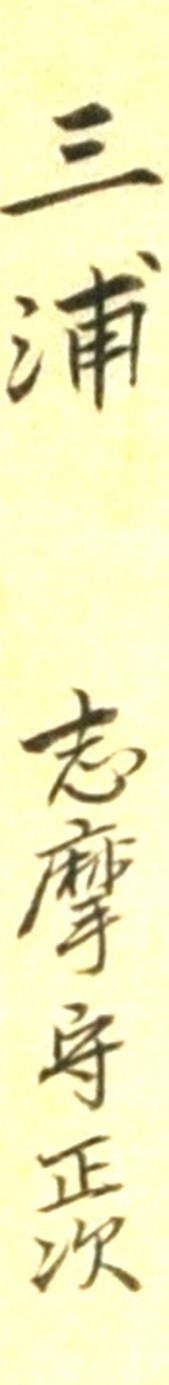三浦志摩守正次
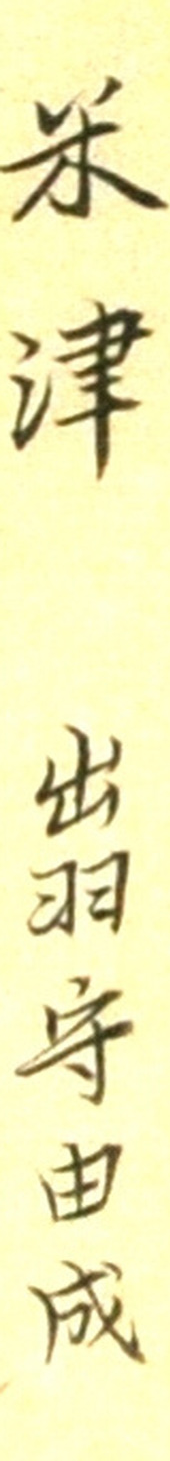米津出羽守由成
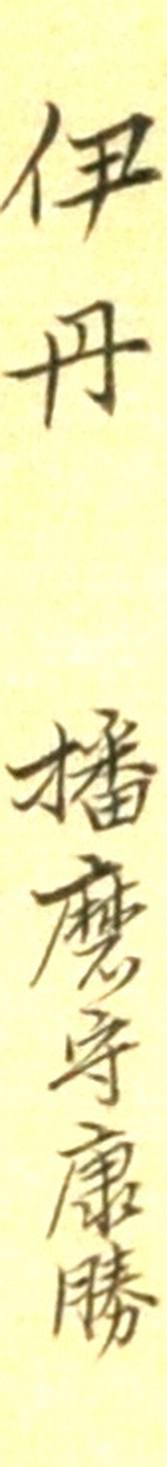伊丹播磨守康勝

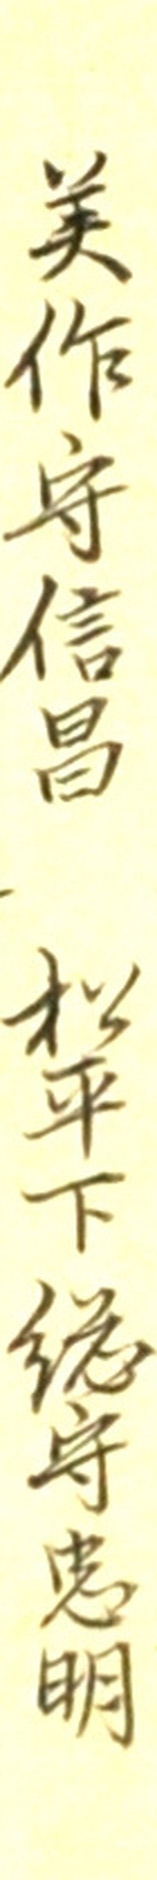奥平美作守信昌松平下総守忠明
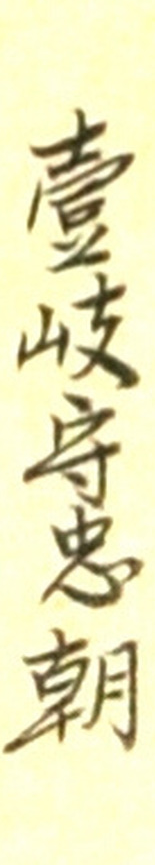壱岐守忠朝
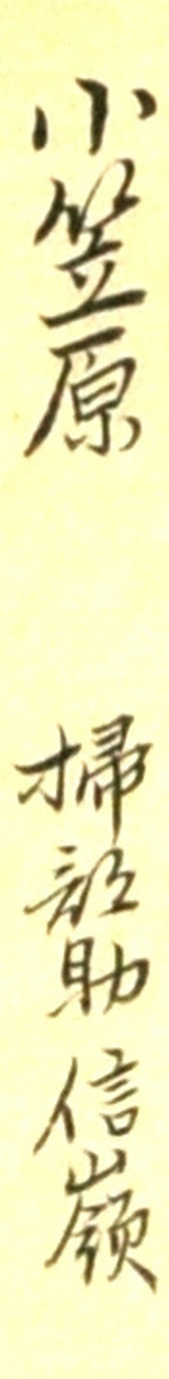小笠原掃部助信峰
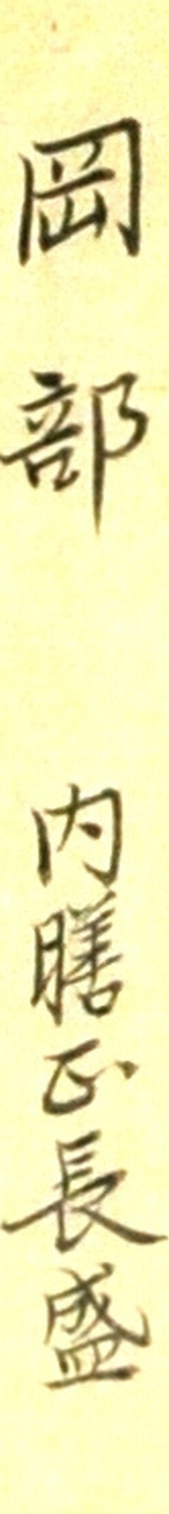岡部内膳正長盛
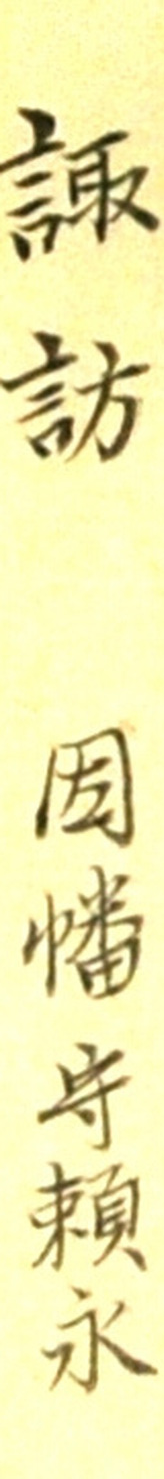諏訪因幡守頼永

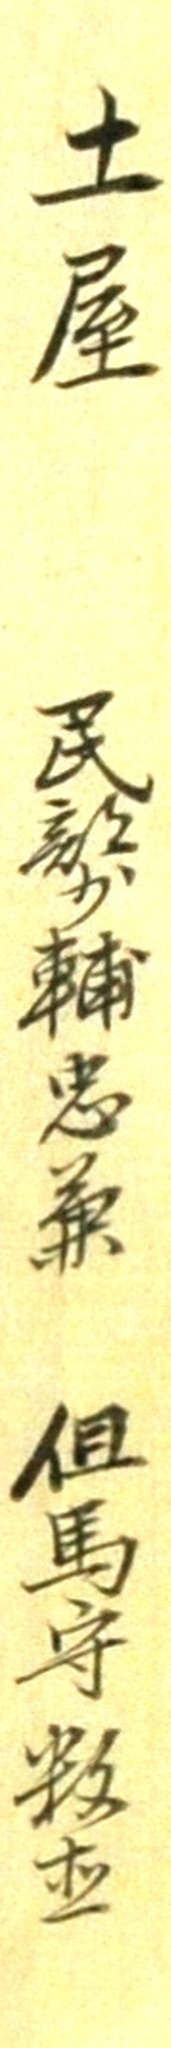土屋民部少輔忠兼但馬守数直
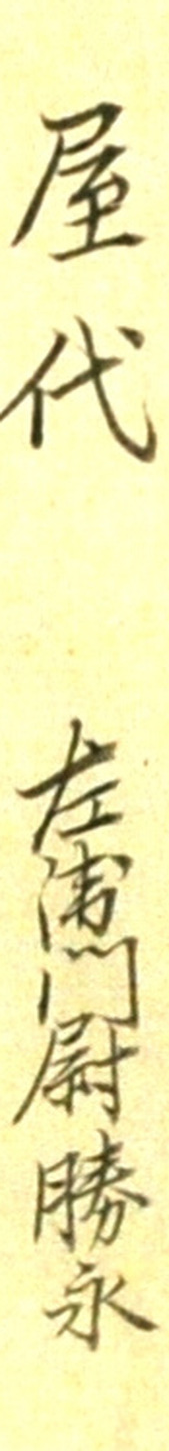屋代左衛門尉勝永
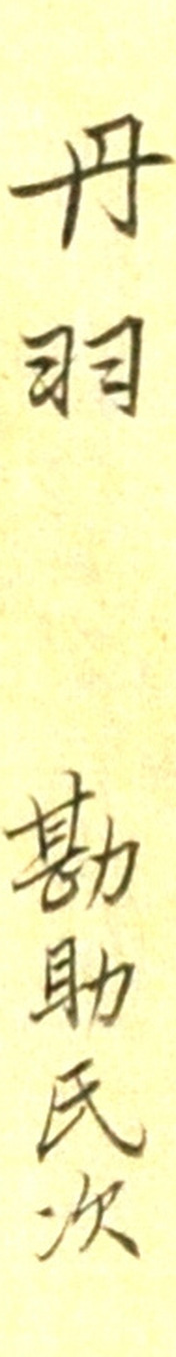丹羽勘助氏次
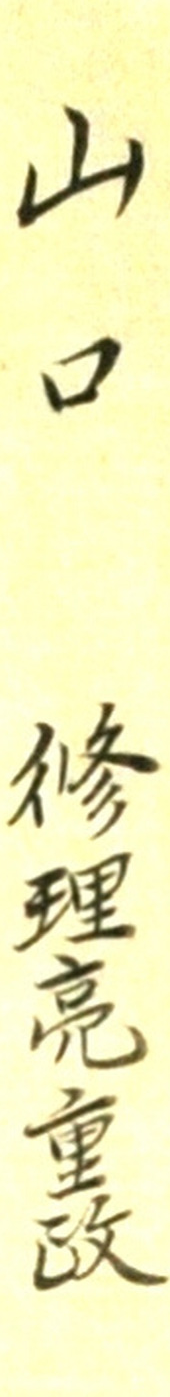山口修理亮重政
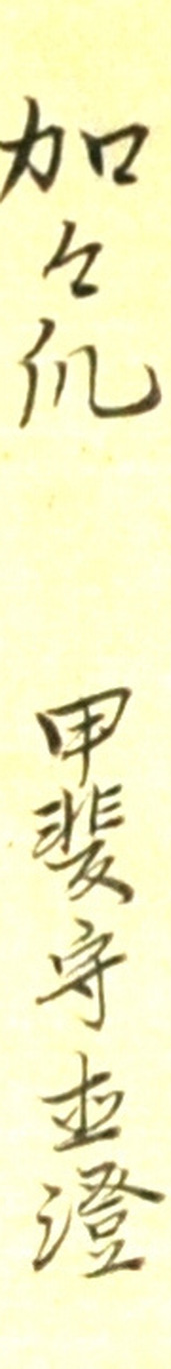加々爪甲斐守直澄
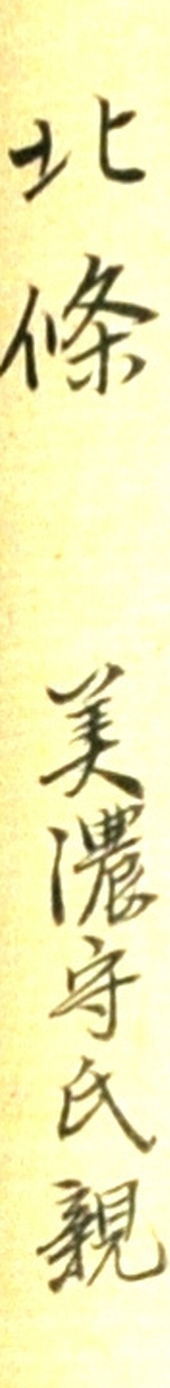北条美濃守氏親
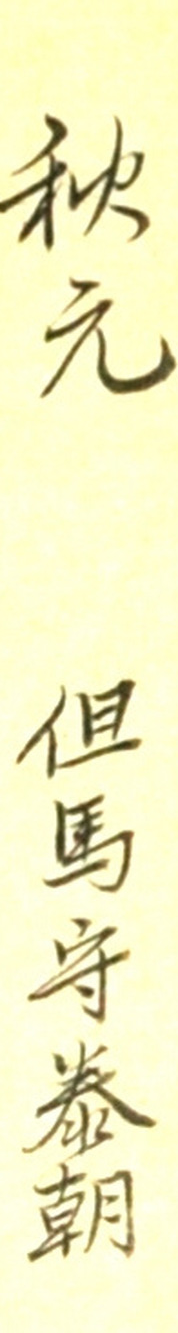秋元但馬守泰朝
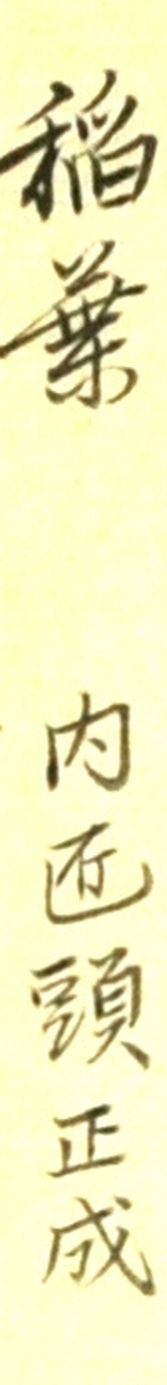稲葉内匠頭正成
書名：藩翰譜（一）
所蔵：伊那市立高遠町図書館・合同会社AMANE
